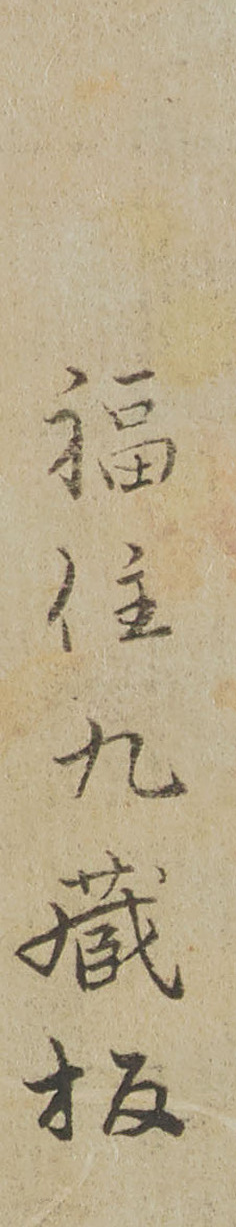福住九蔵板
